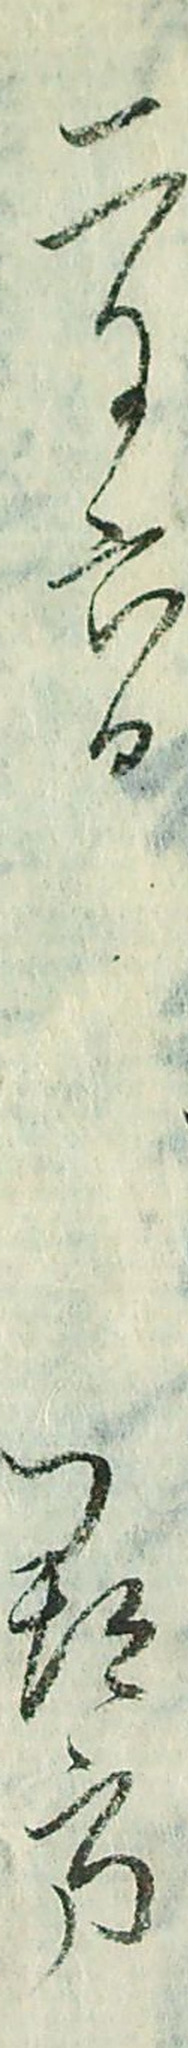二月六日郡方
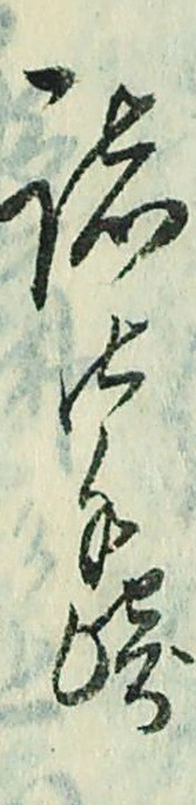諸御手崎

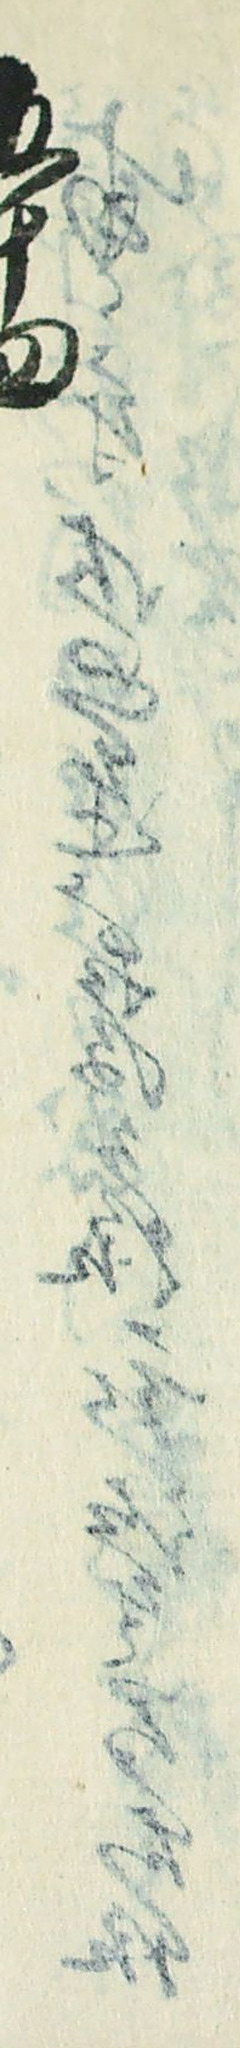五十四
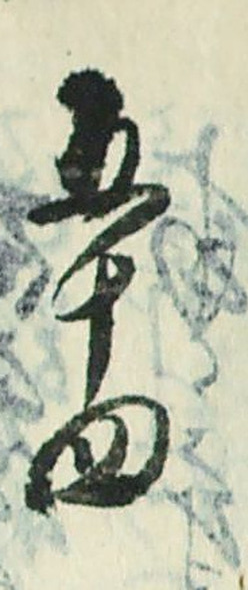五十四

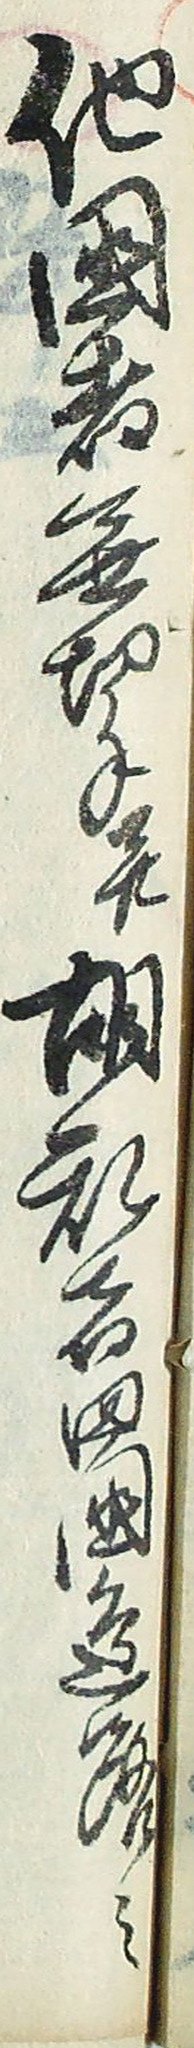他国者無切手幷胡乱者四国邊路之
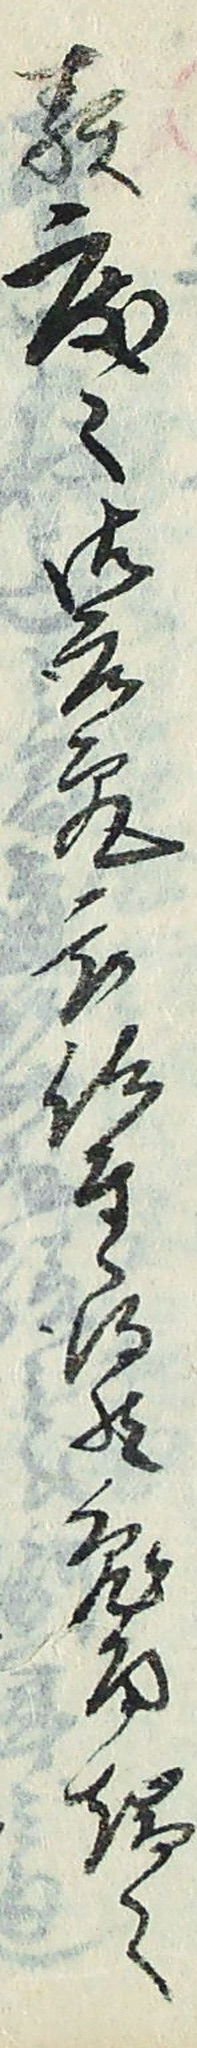類度々御取究被仰付候得共兎角端々
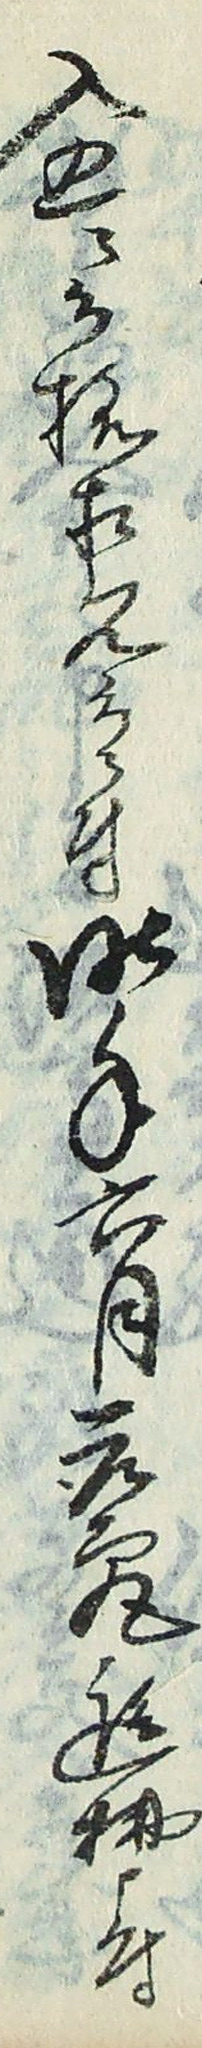入込ニ候様相見候ニ付昨年六月取究追拂申付
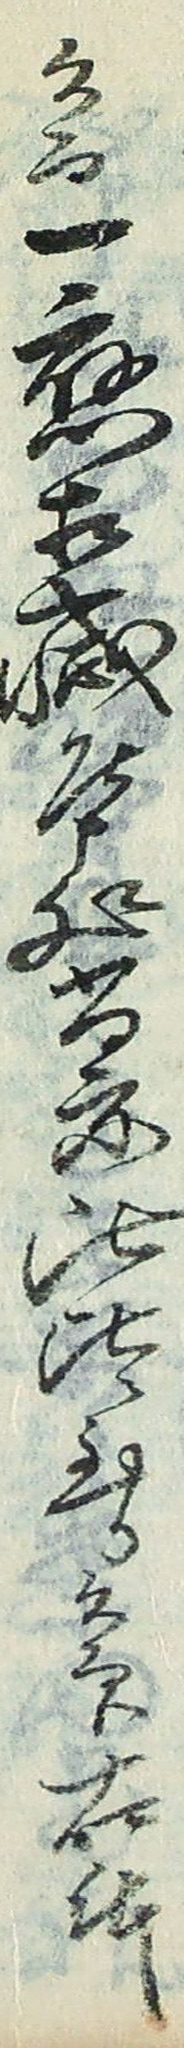候而一應相減居申処尚亦此比ニ至り候而ハ右体
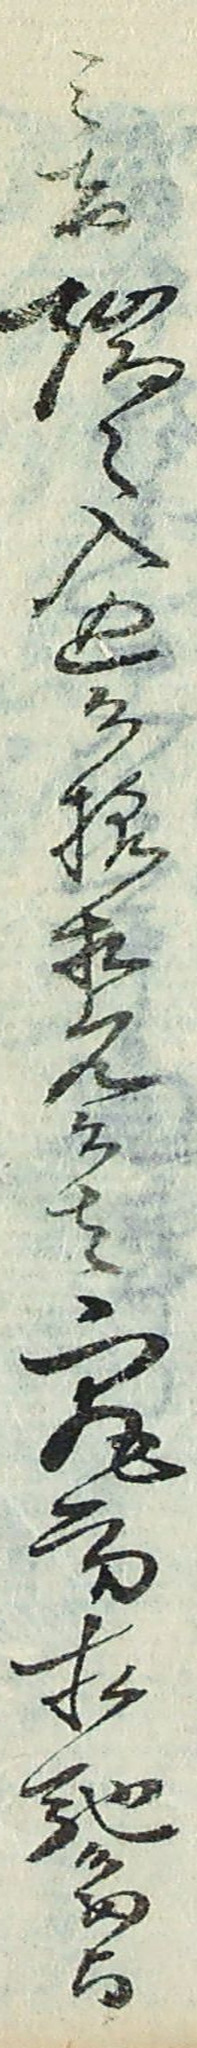之者端々入込候様相見候者究方相弛候義と
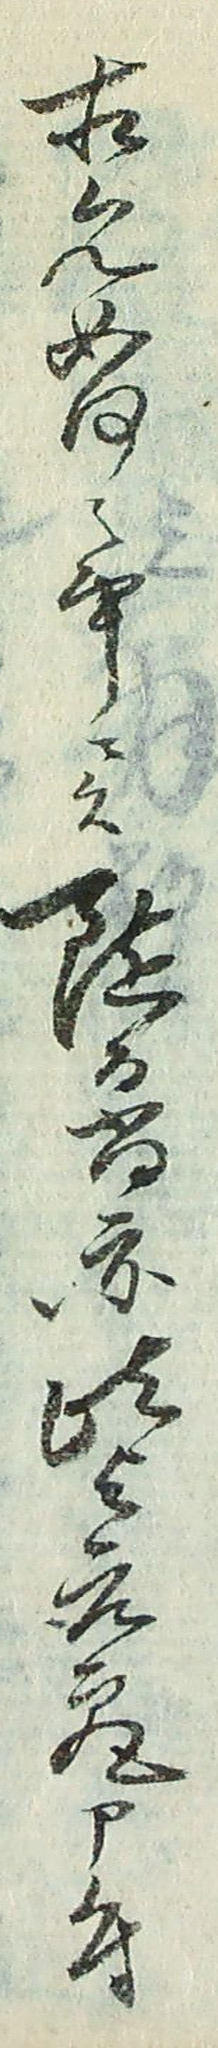相見如何之事ニ候随而尚亦屹と取究申付
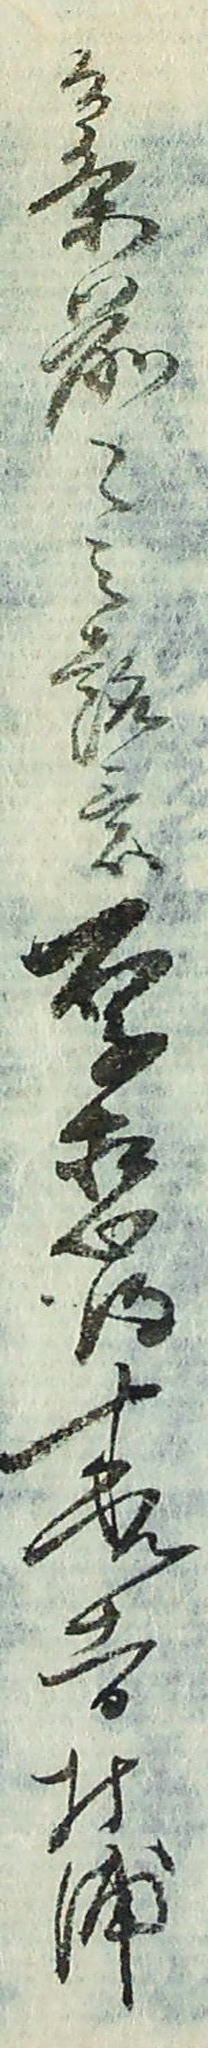候条前々之趣意厚相心得来ル十一日村浦
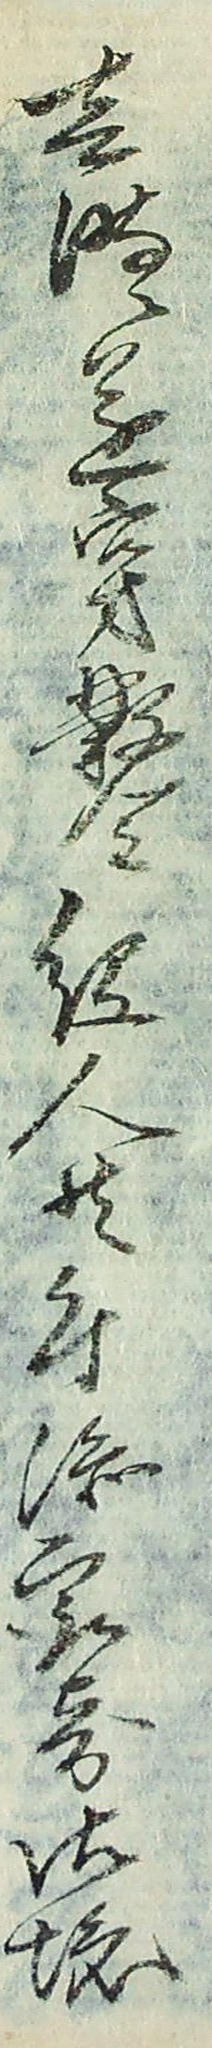吉時ニ遂穿鑿役人共付添最寄御境
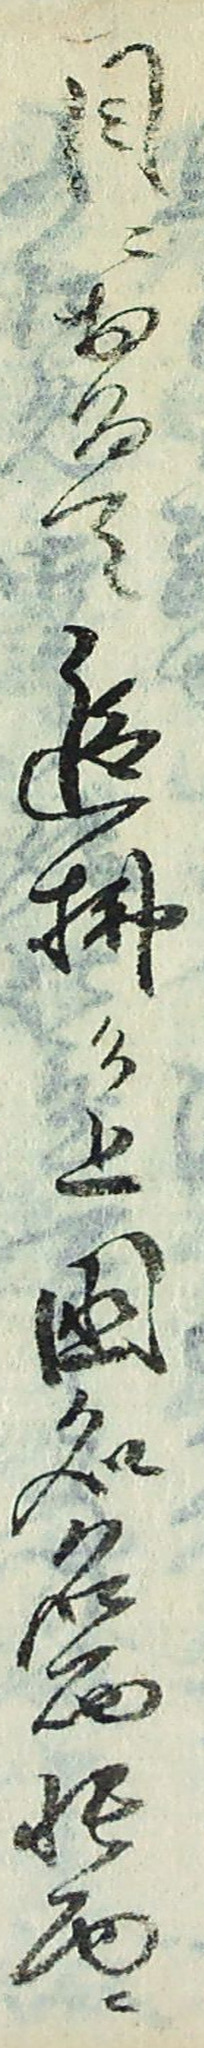目ニおゐて追拂候上国処名面帳面ニ
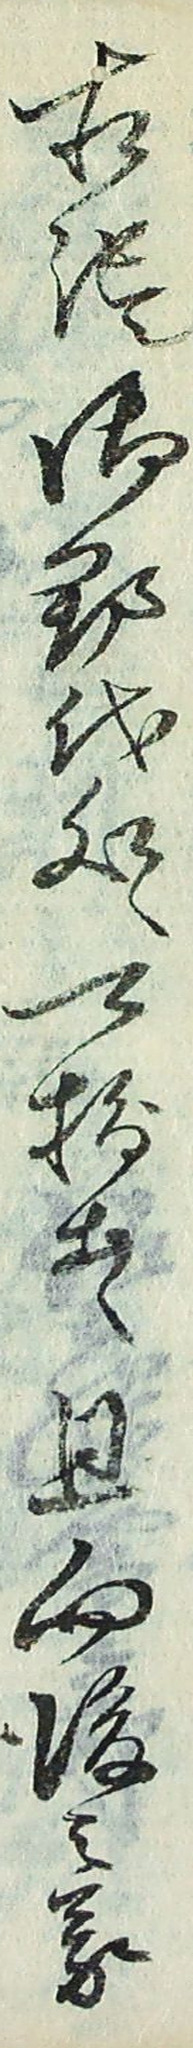相記シ御郡代処へ可指出候且向後之義
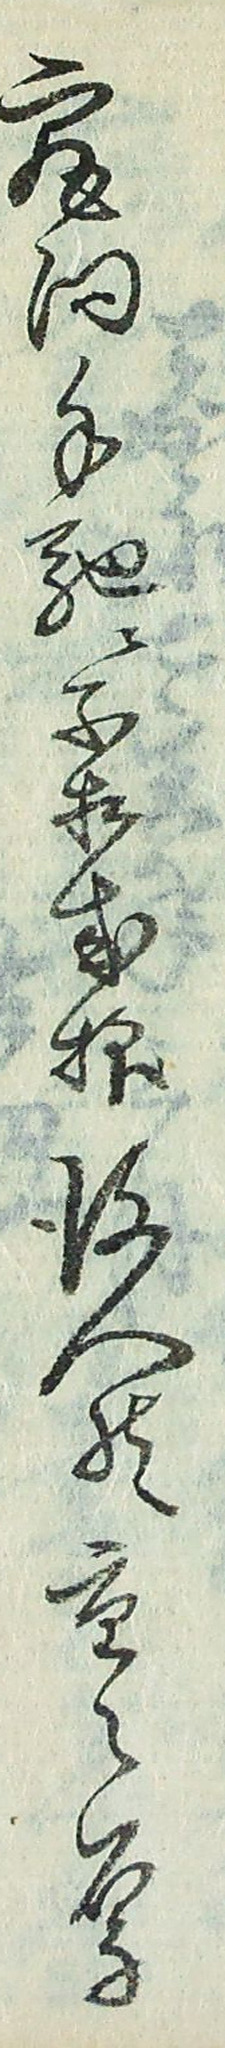究向手弛ニ不相成様役人共重々厚
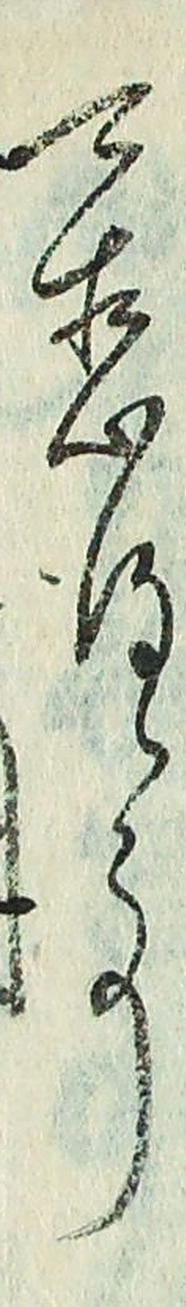可相心得候事
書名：諸御趣意書并御下知向之写
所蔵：鳴門教育大学 Naruto University of Education
